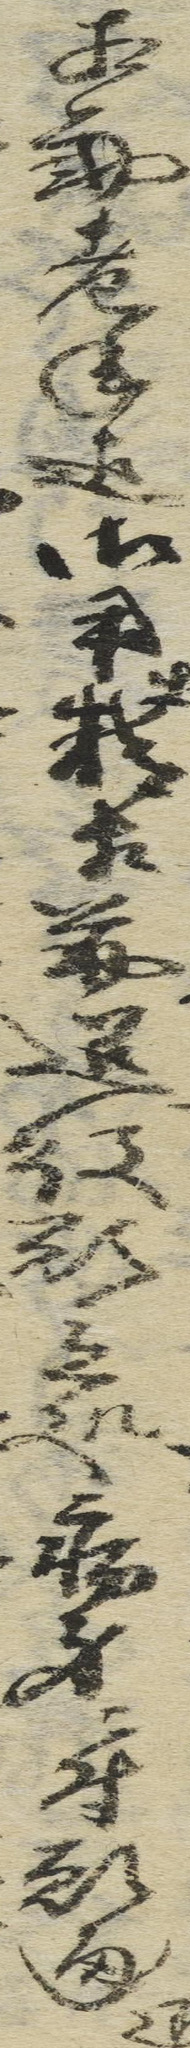相勤老年迄御用状相勤退役願立処病身二付願通退役
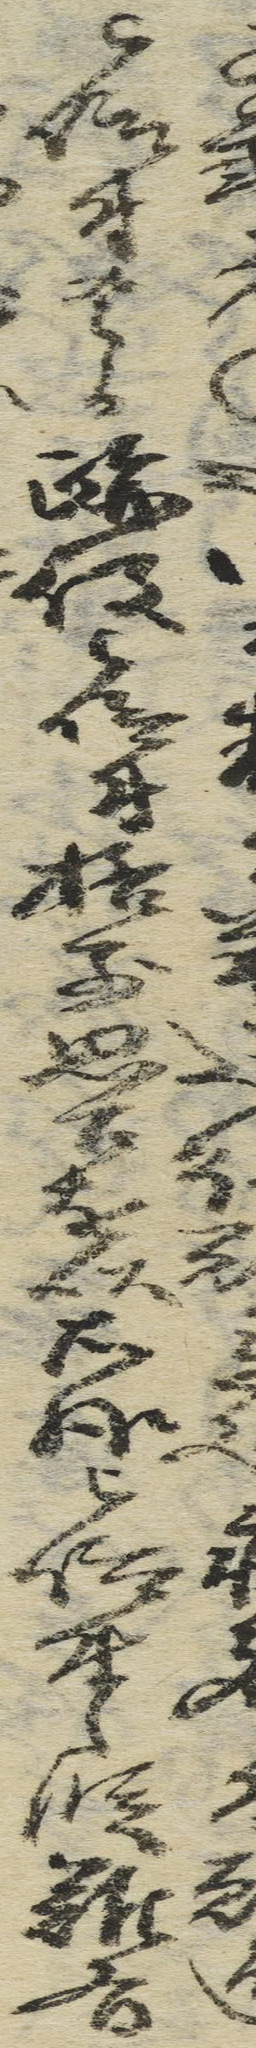被仰付今日跡役被仰付格別思召を以右様被仰付候段難有
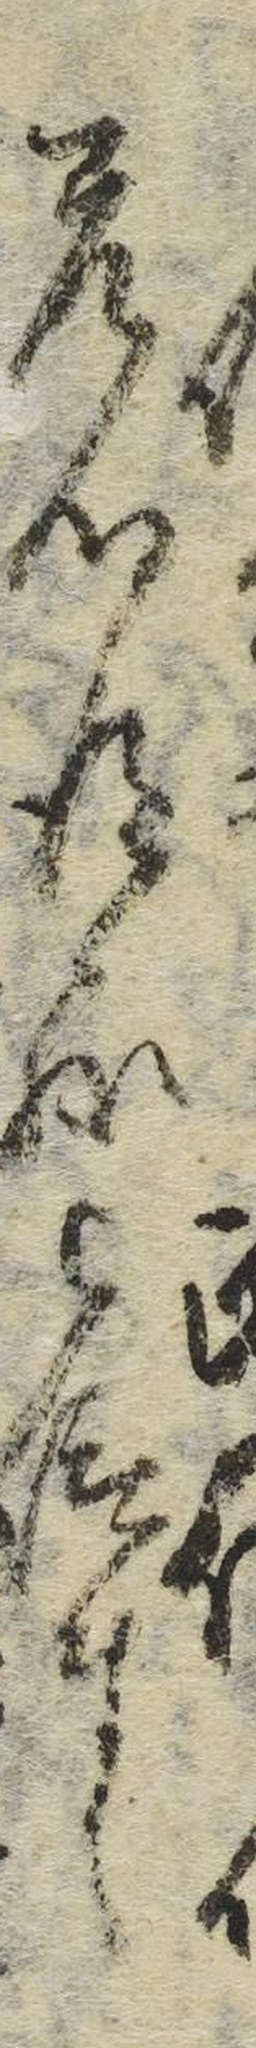差心得候様被仰付候
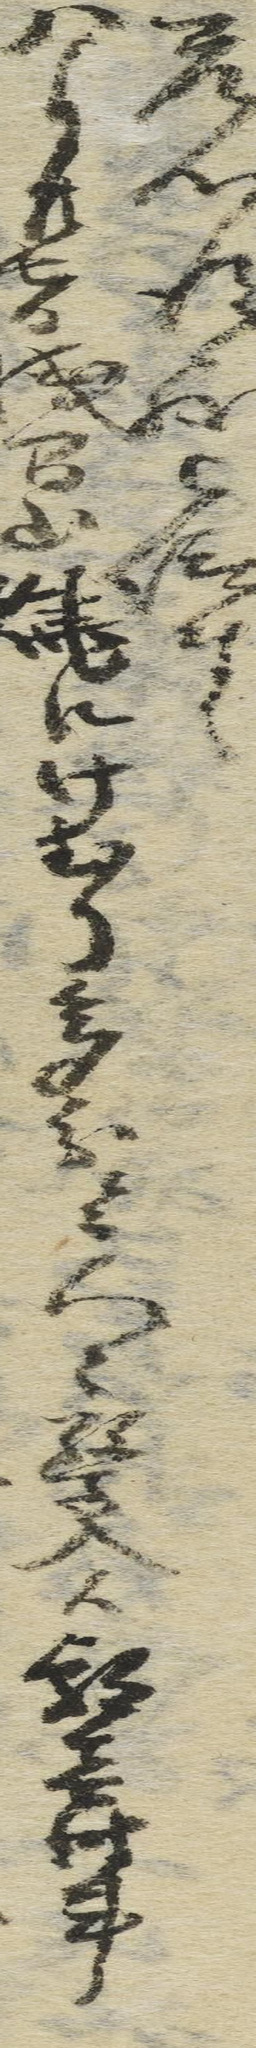八月廿七日浅間山焼ㇽけむり多分二而人々驚入候朝壱時計
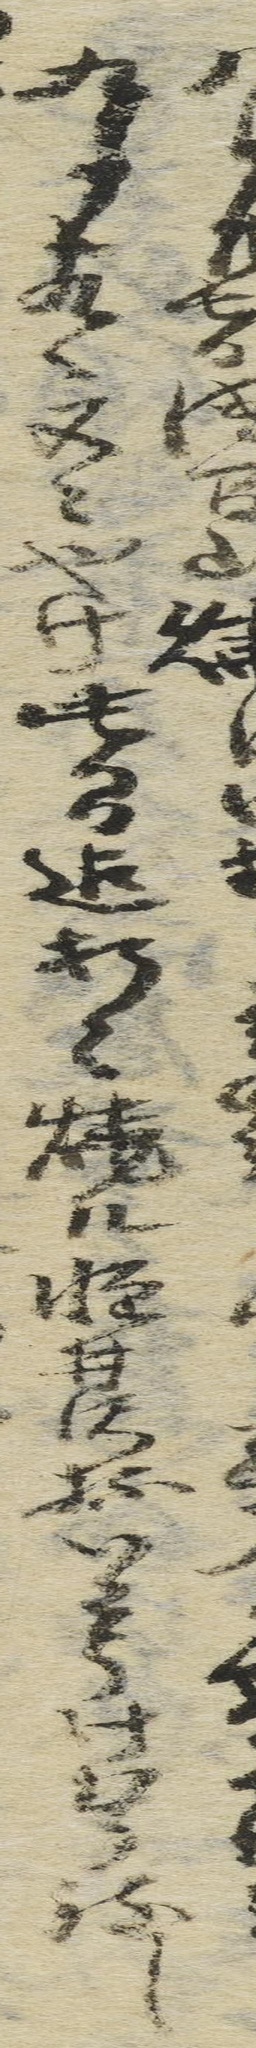九月十九日又々やけ此間迄折々焼ㇽ軽井沢抔いまたけむり致候
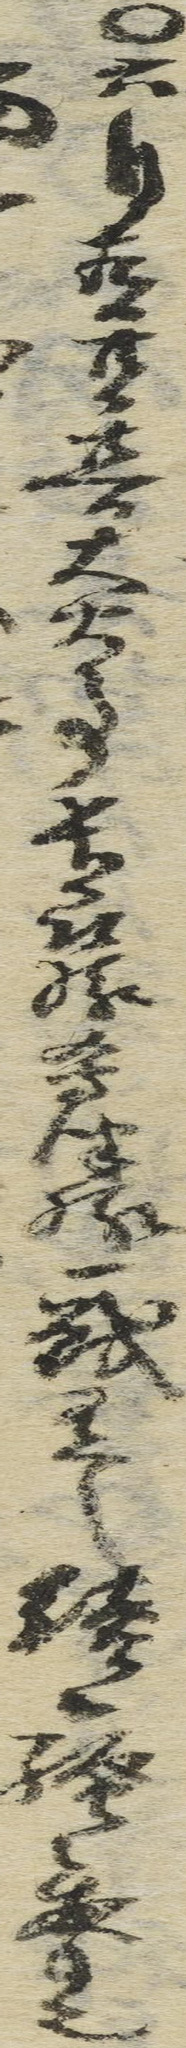○六月十九日廿日廿一日大火事長州様会津様一戦有之終日騒し敷日也
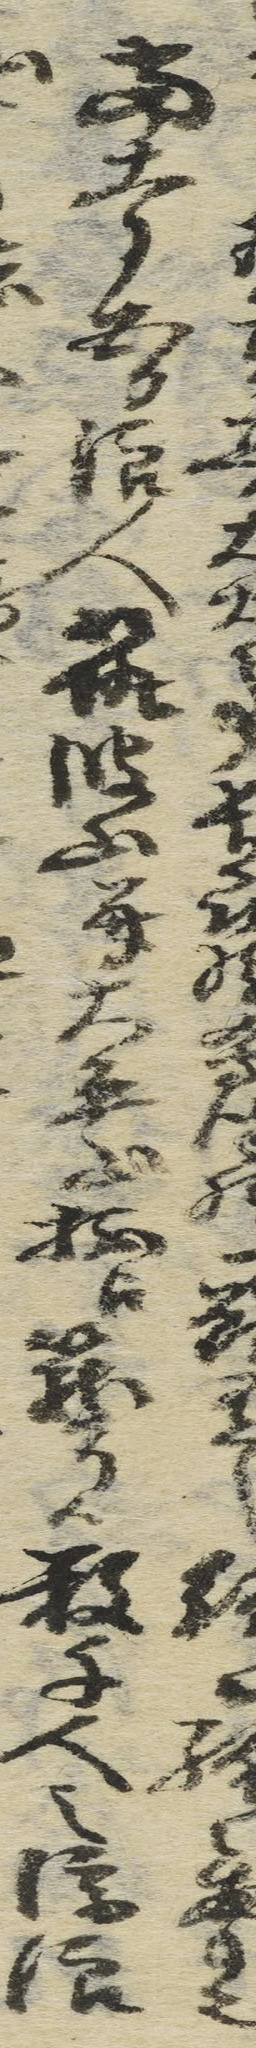当十一月五日浪人筑波山并大平山抔江籠り候数千人之浮浪
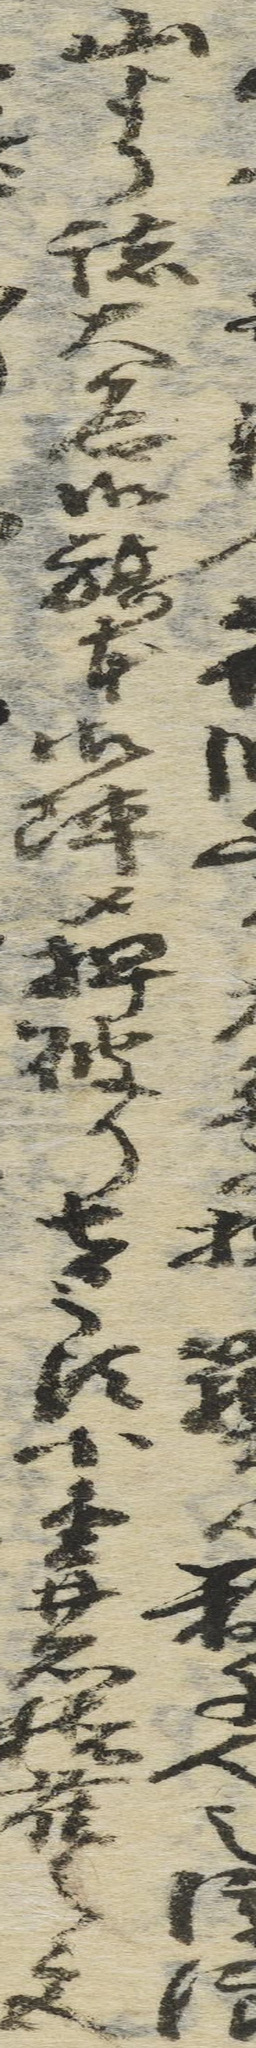山より諸大名御旗本御陣〆押破り七日之頃小金井石橋雀之宮
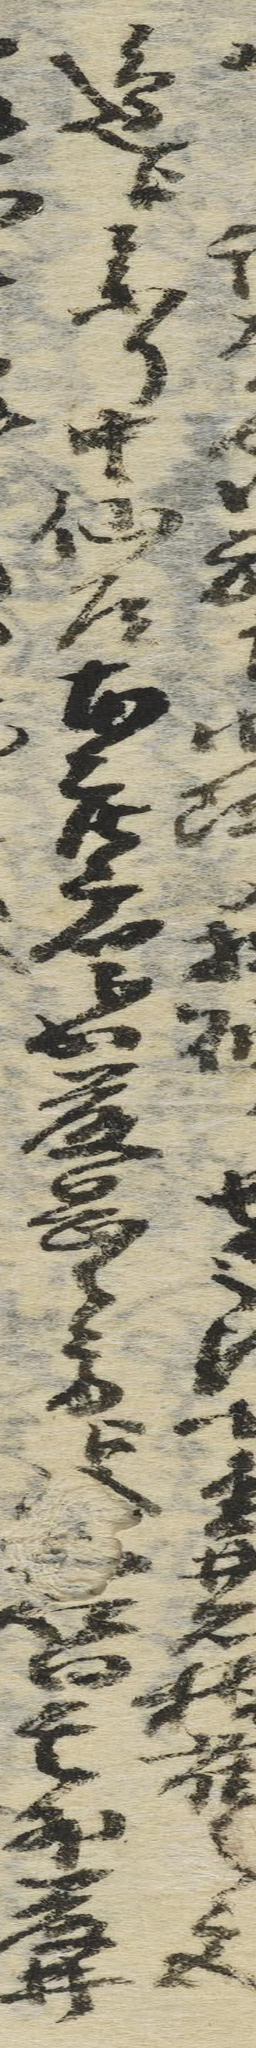辺江参り中仙道本庄宿江出藤岡之方江其外藤井
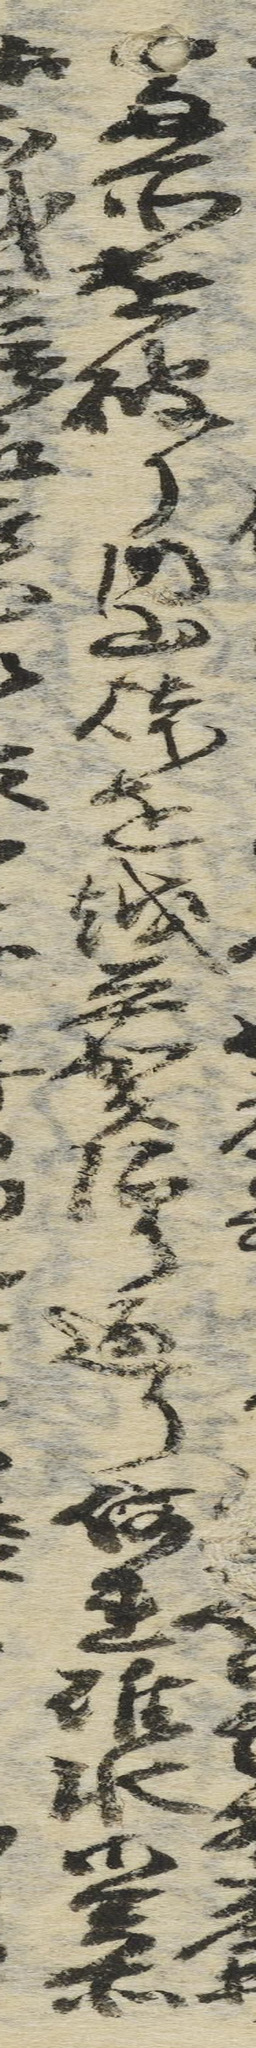御番所を破り内山峠を越平賀泊り通り何れ碓氷御関所
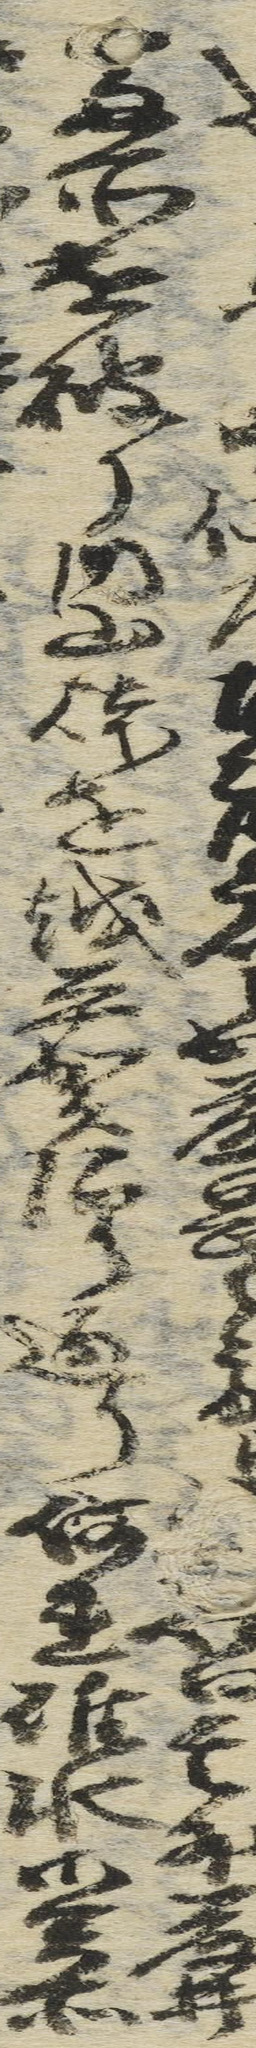御番所を破り内山峠を越平賀泊り通り何れ碓氷御関所
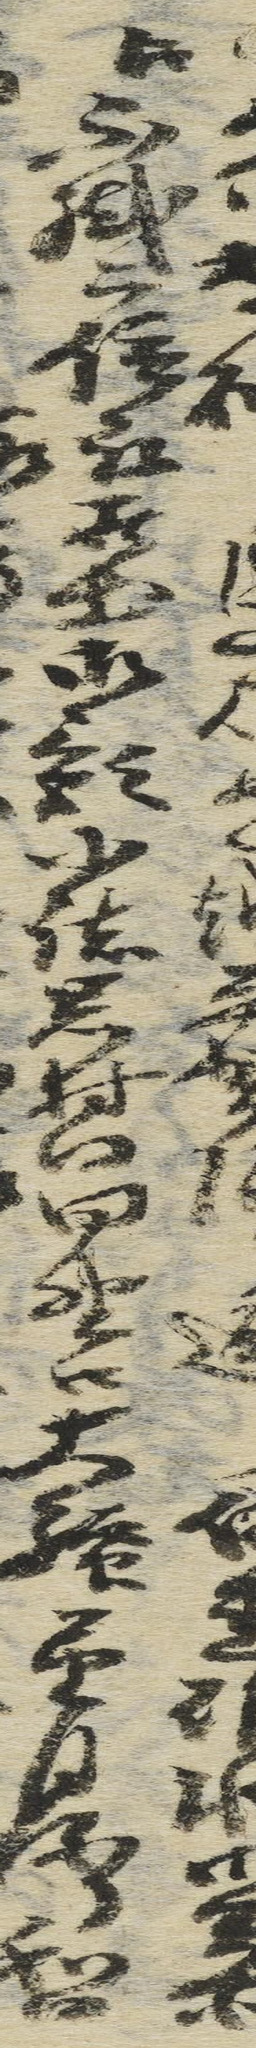江不掛二信州罷出御領小諸岩村田田野口大騒望月泊り和田
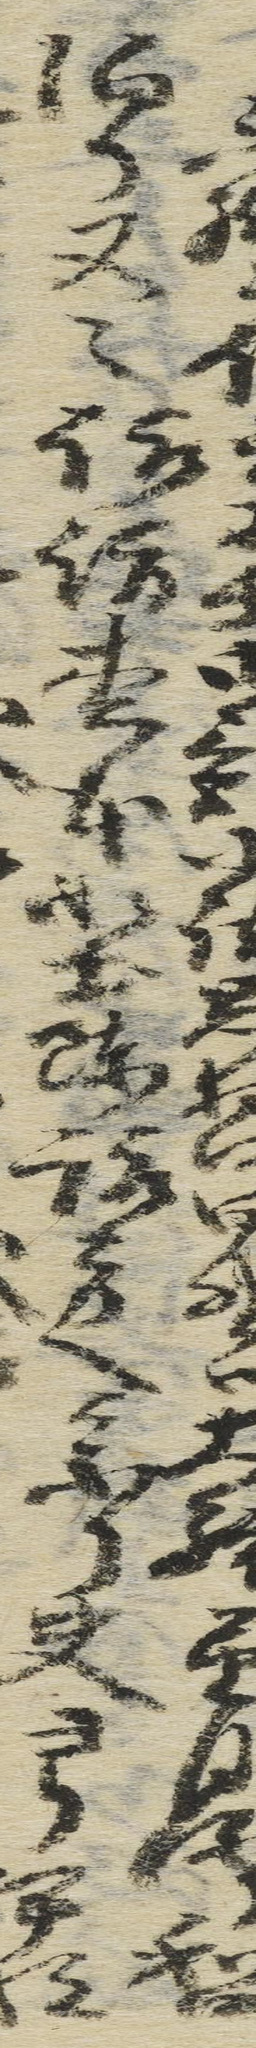泊り又々諏訪松本御本陣諏方へとふり夫ヨリ伊那
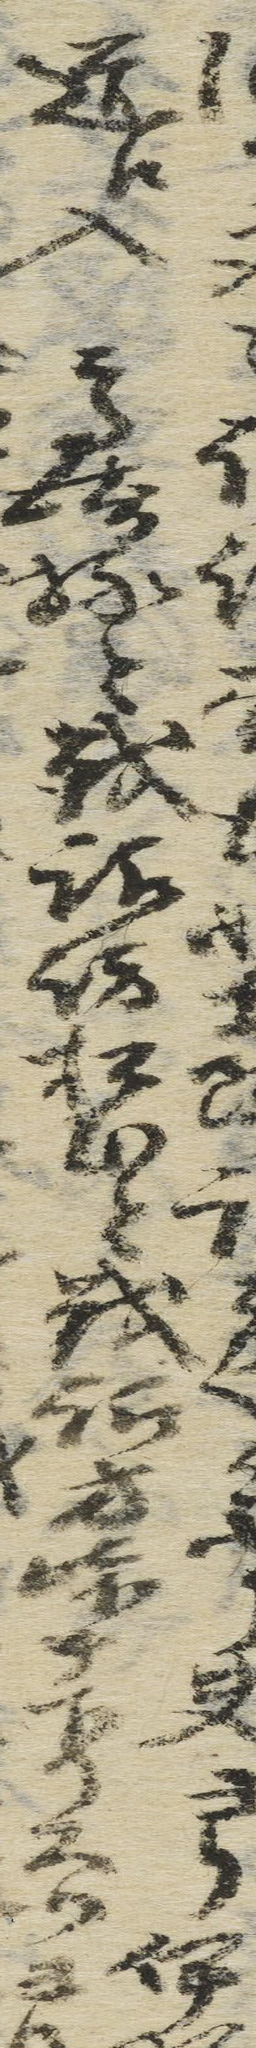道江入高崎様と戦諏訪松本と戦諏方峠ヲ下りスワヨリ
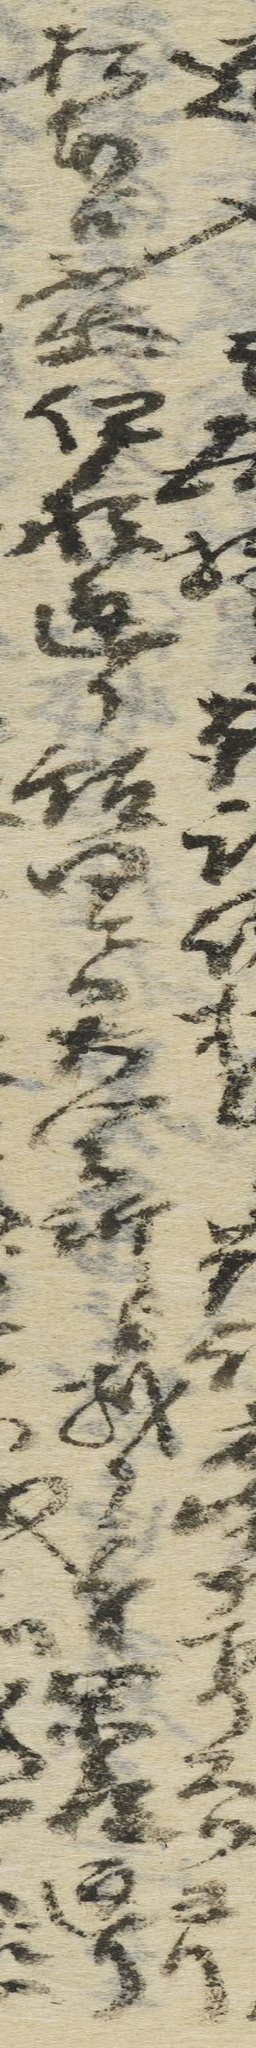松本江不出伊那通り飯田二而大関所江掛り二付平谷通り
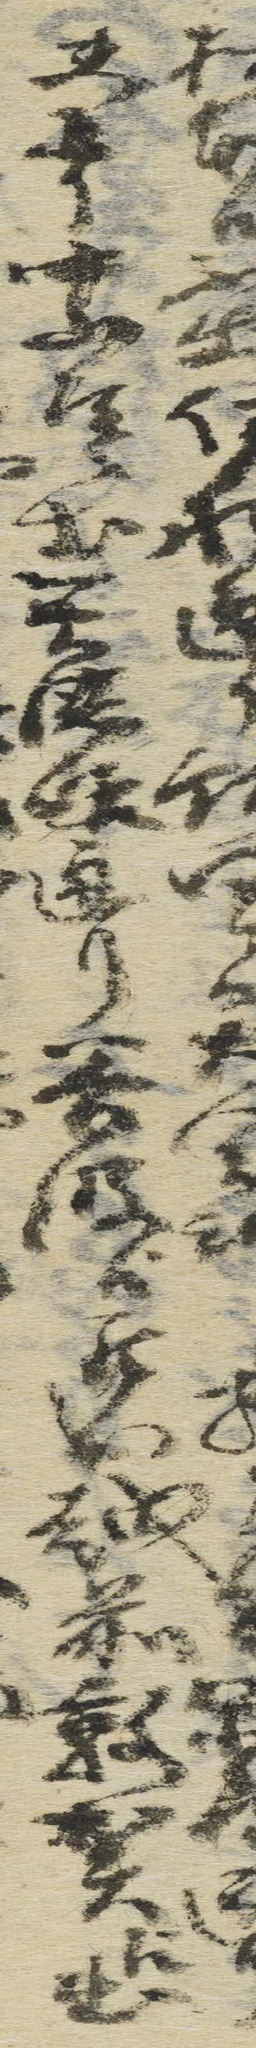夫より中山道二出美濃路通行谷汲江罷出越前敦賀江出
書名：信濃越後　地震書留
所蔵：東京大学地震研究所図書室 Earthquake Research Institute Library, The University of Tokyo, JAPAN
